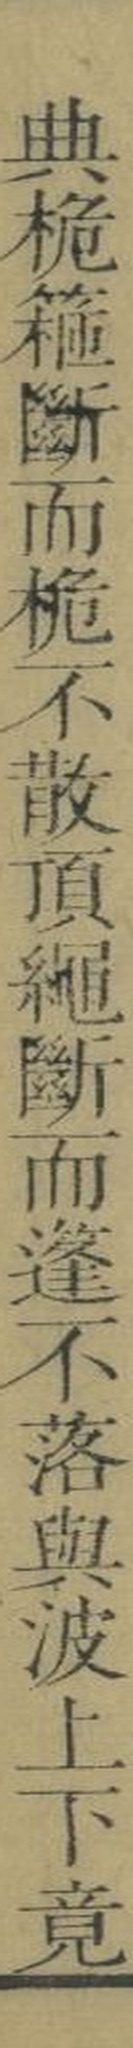典桅篐斷而桅不散頂繩斷而篷不落與波上下竟

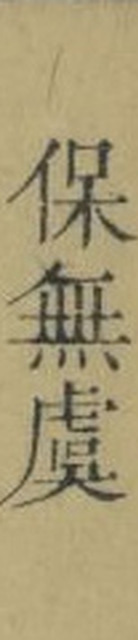保無虞
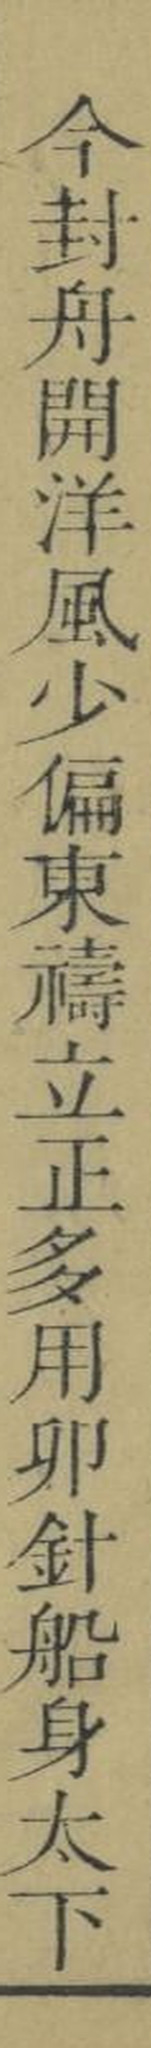今封舟開洋風少偏東禱立正多用卯針船身太下
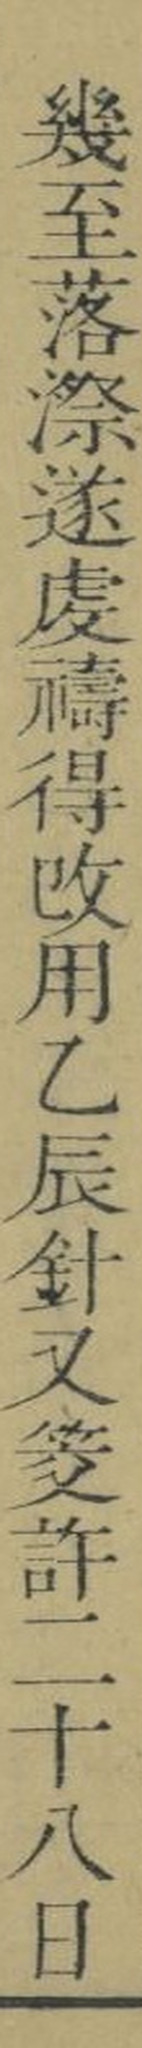幾至落漈遂䖍禱得攺用乙辰針又筊許二十八日
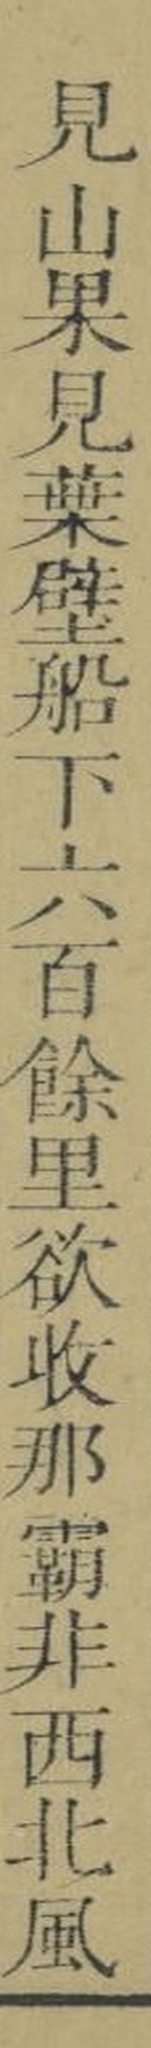見山果見葉壁船下六百餘里欲收那霸非西北風
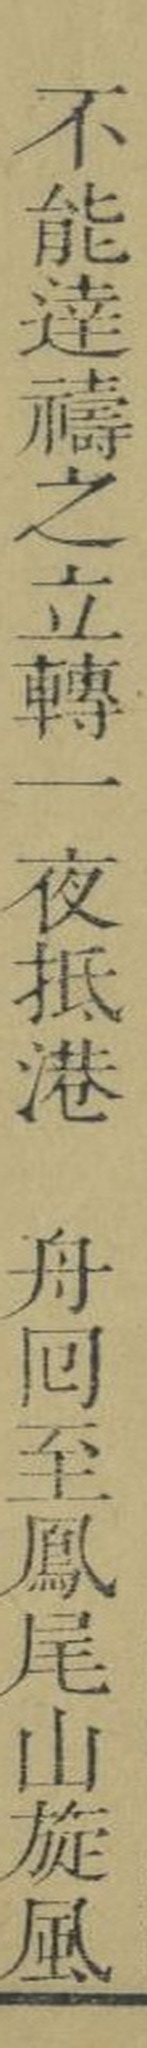不能逹禱之立轉一夜抵港舟囘至鳳尾山旋風
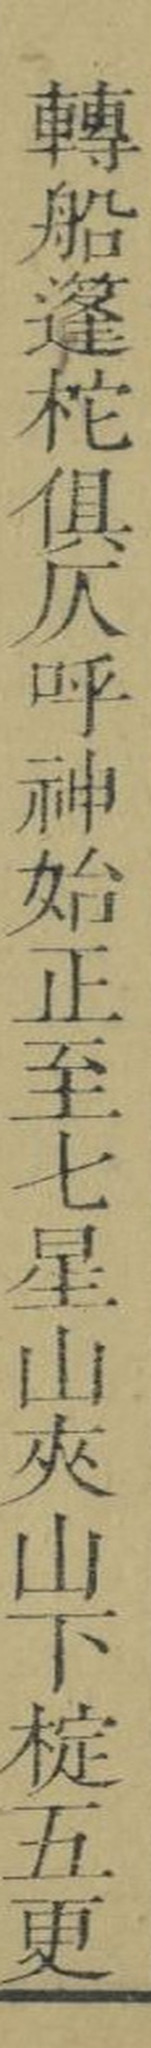轉船篷柁俱仄呼神始正至七星山夾山下椗五更
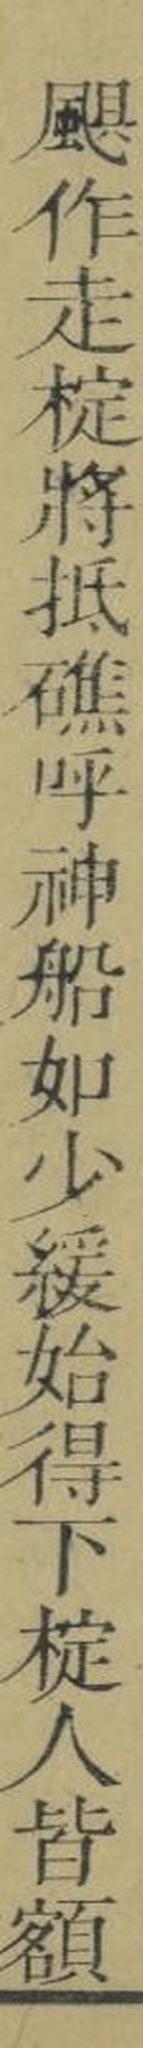颶作走椗將抵礁呼神船如少緩始得下椗人皆額
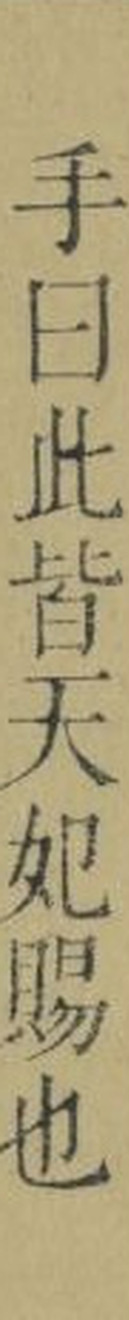手曰此皆天妃賜也
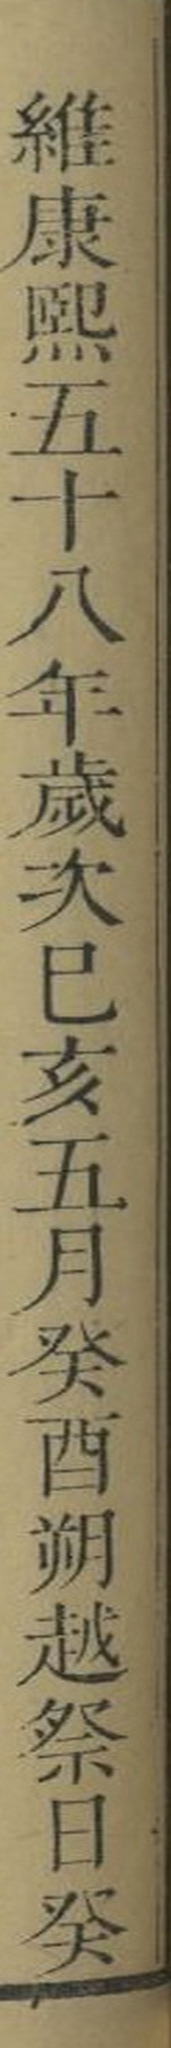維康熙五十八年歲次巳亥五月癸酉朔越祭日癸
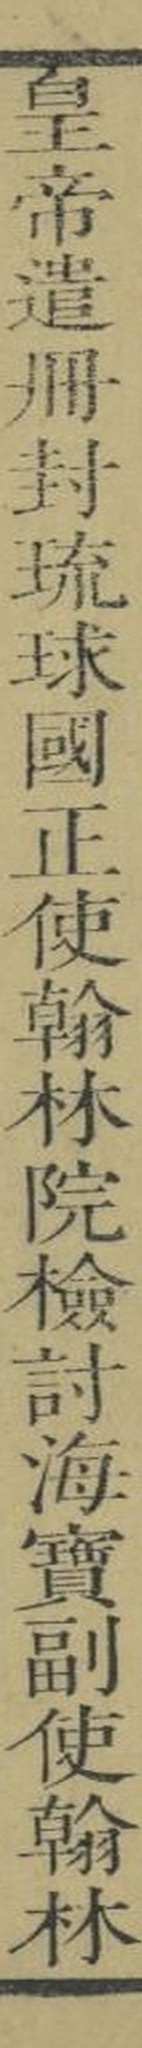皇帝遣冊封琉球國正使翰林院檢討海寶副使翰林
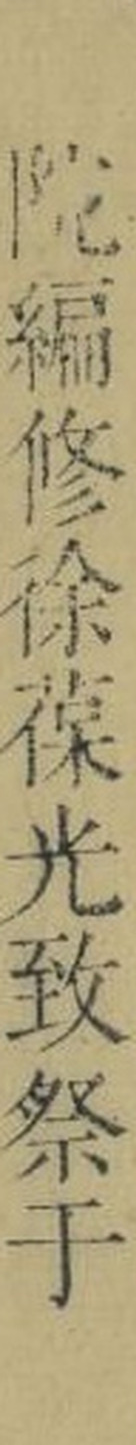院編修徐葆光致祭于
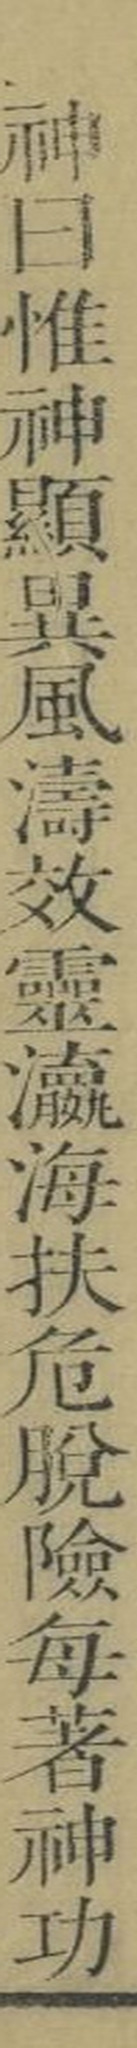神曰惟神顯異風濤效靈瀛海扶危脫險每著神功
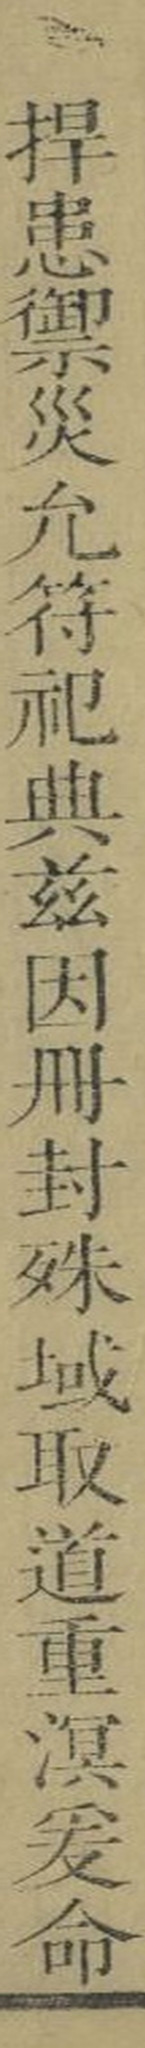捍患禦災允符祀典茲因冊封殊域取道重溟爰命
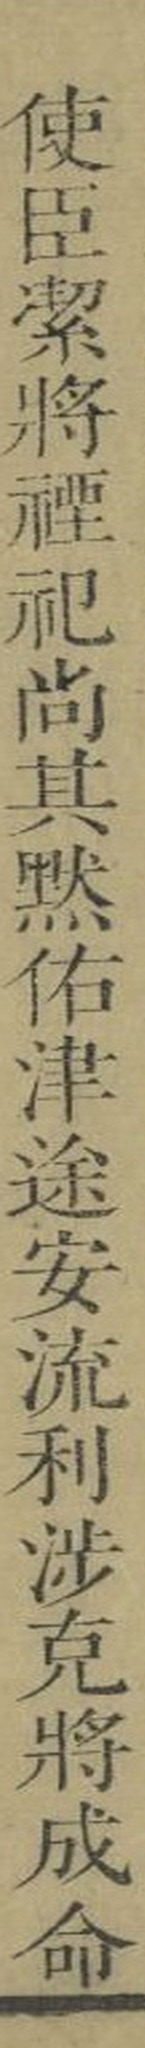使臣㓗將禋祀尚其默佑津途安流利涉克將成命
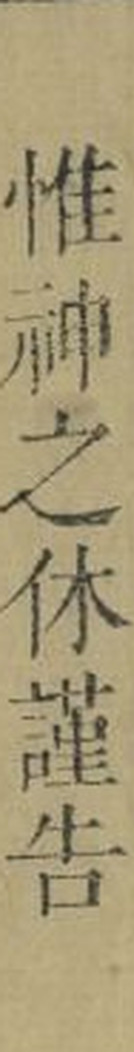惟神之休謹告
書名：中山伝信録 巻一
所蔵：University of the Ryukyus Library
